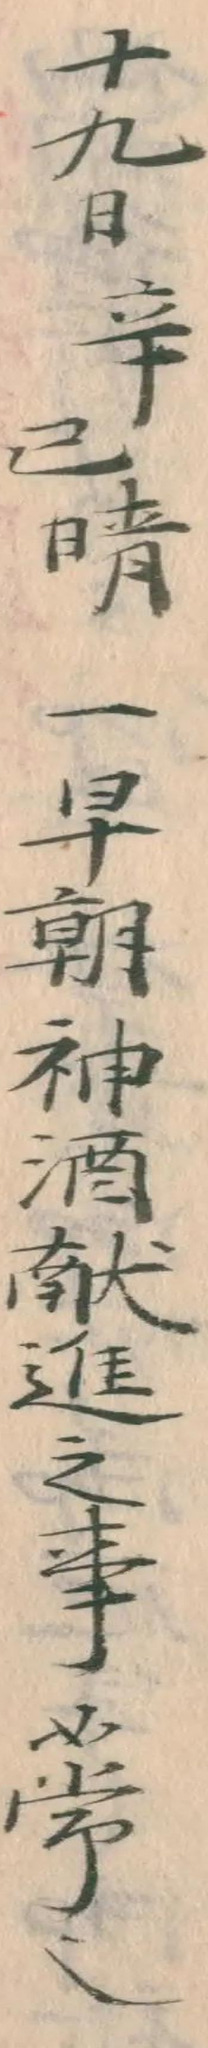十九日辛巳晴一早朝神酒献進之事如常也
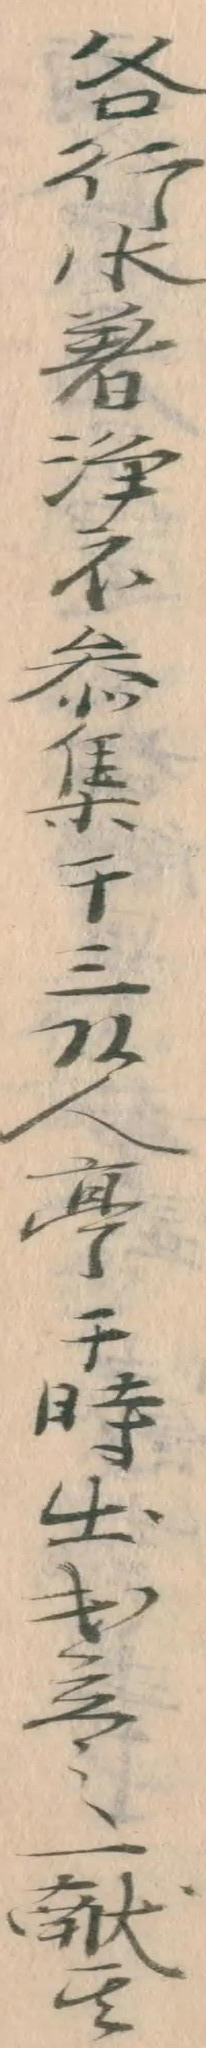各行水着浄衣参集于三頭人亭于時出義立之一献其
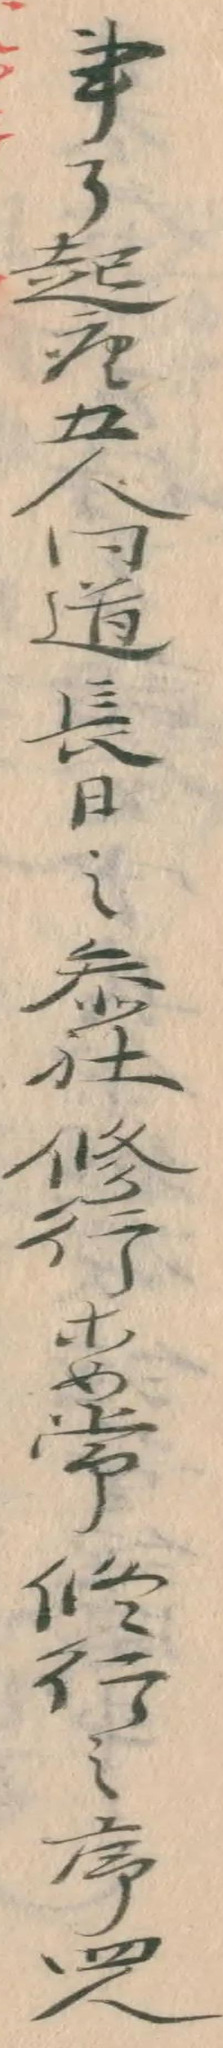事了起座五人同道長日之参社修行等如常修行之序四人
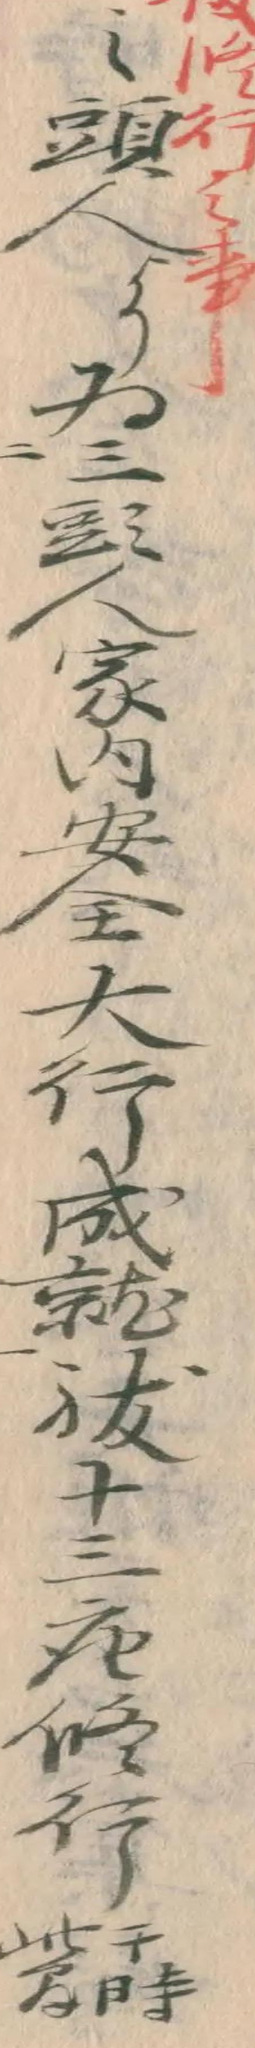之頭人より為三頭人家内安全大行成就祓十三座修行于時此間
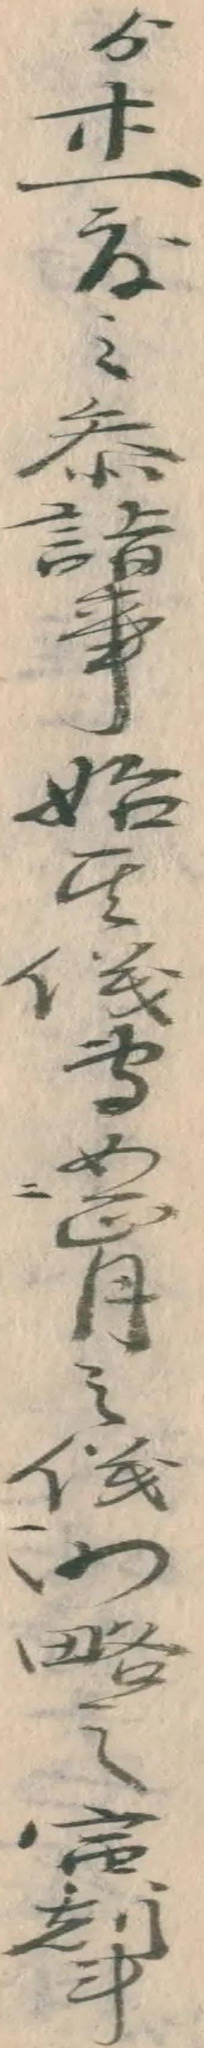ゟ廿一度之参詣事始其儀専如正月之儀仍略之寅刻斗
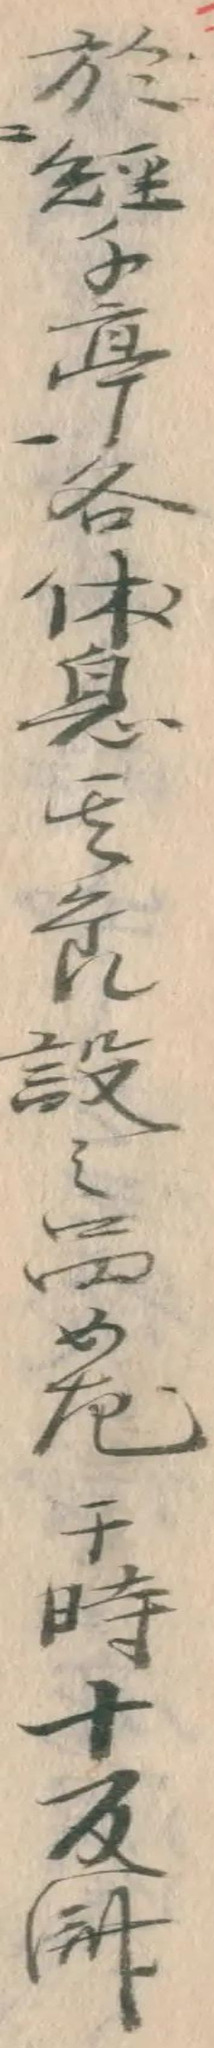於経千亭各休息其節設之品如左于時十反済
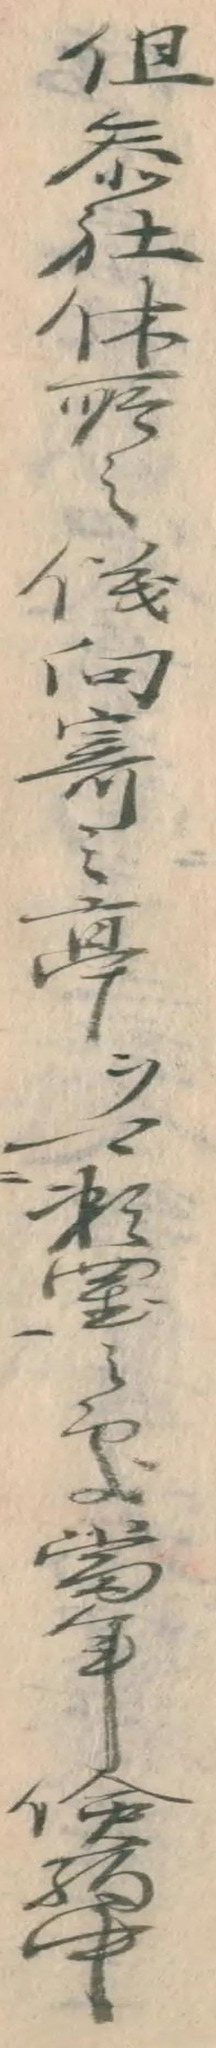但参社休所之儀向寄之亭ヲ可頼置之處當年倹約中
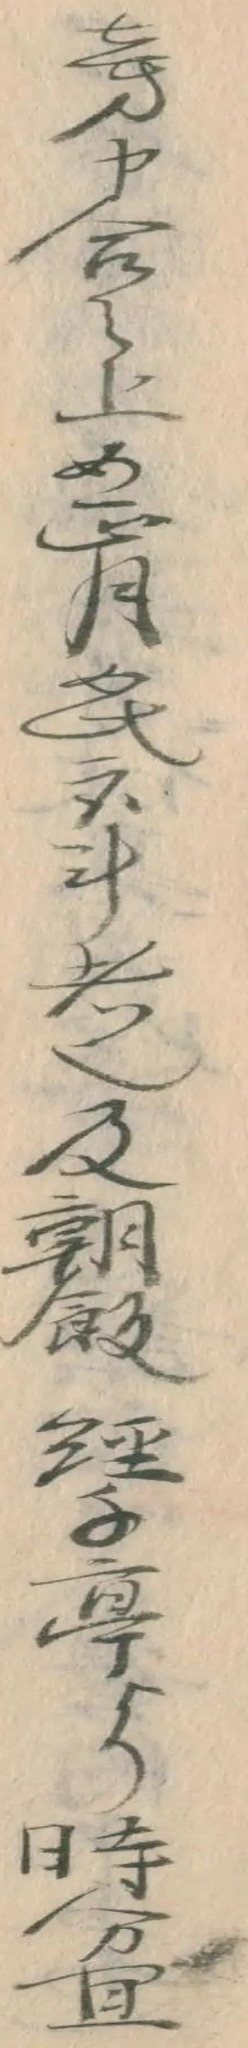旁申合之上如正月如此取斗者也及朝飯経千亭より時分宜

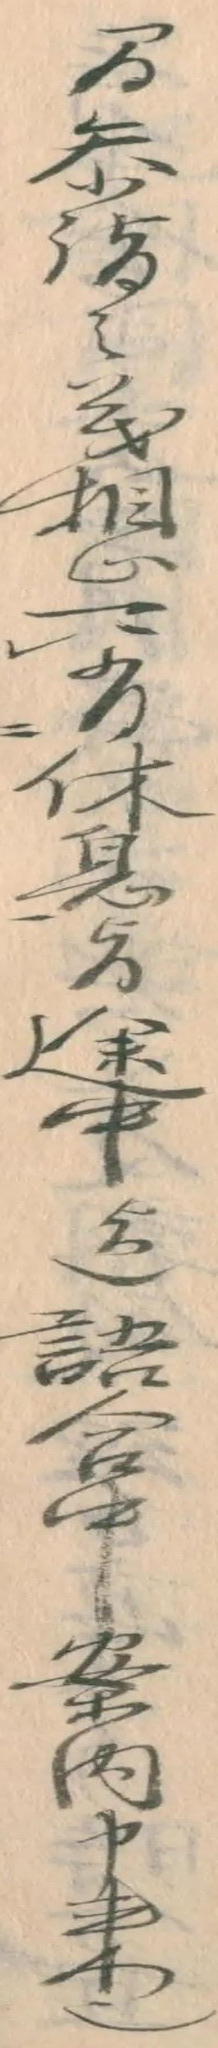間参詣之義相止可有休息旨途中迄語合中案内申来也
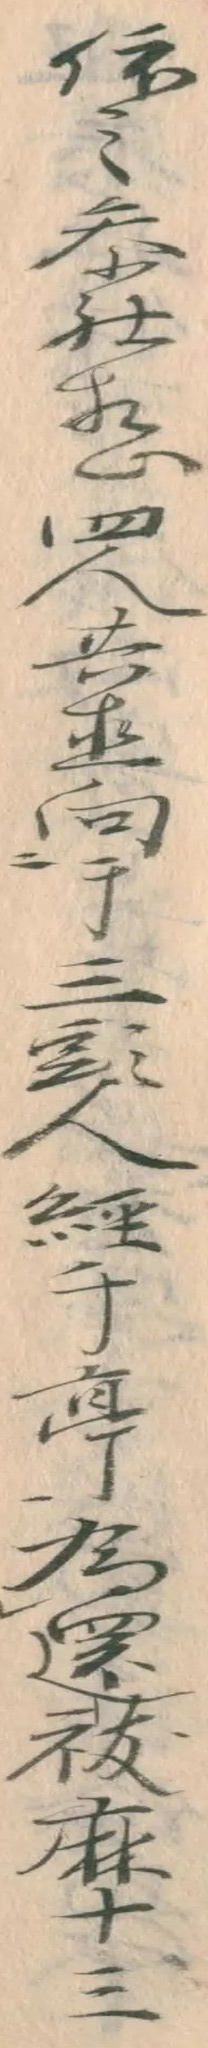依之参社相止四人共直向于三頭人経于亭為還祓麻十三
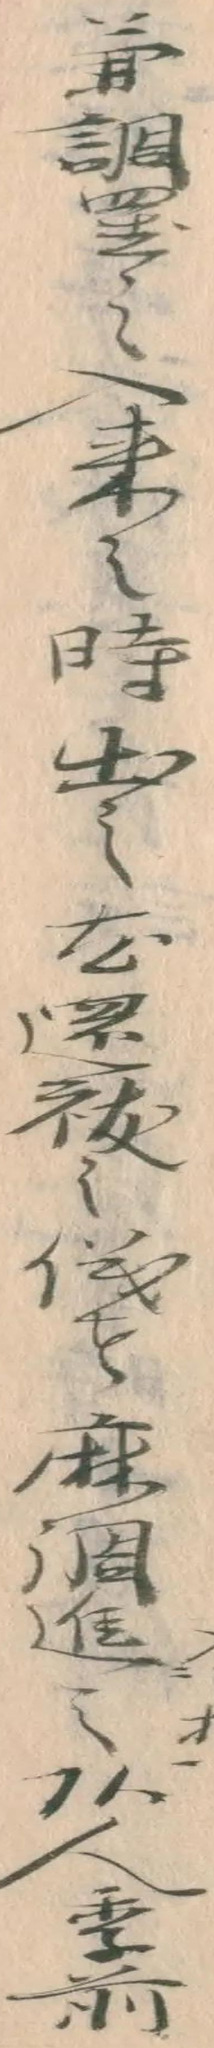兼調置之入来之時出之尤還祓之儀は麻調進之頭人季前
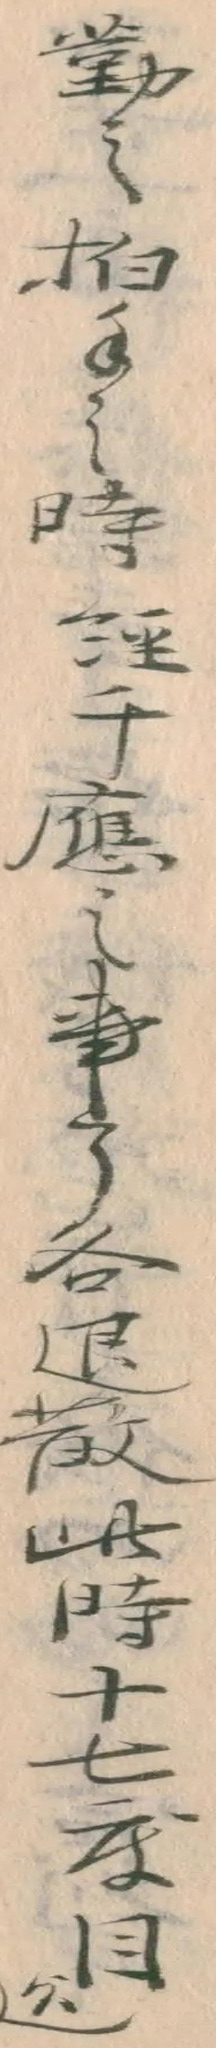勤之拍子之時経千應之事了各退散此時十七度目迄
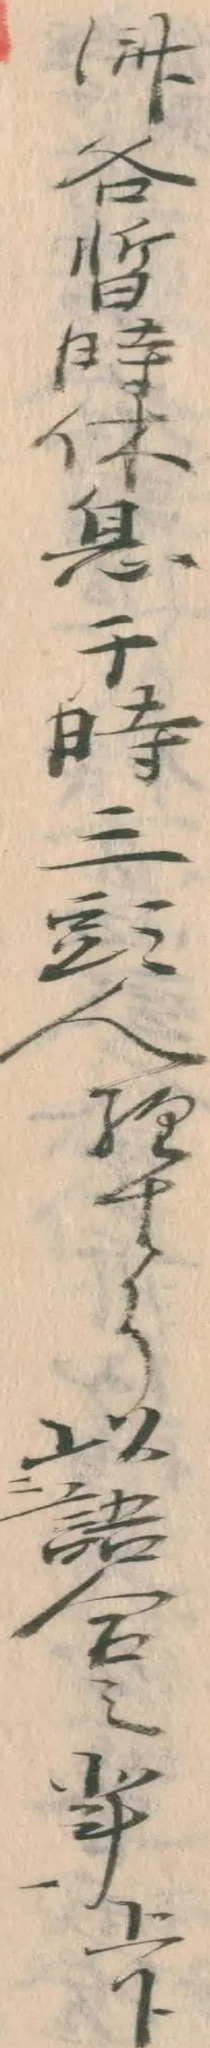済各暫時休息于時三頭人経千より以語合之輩上下
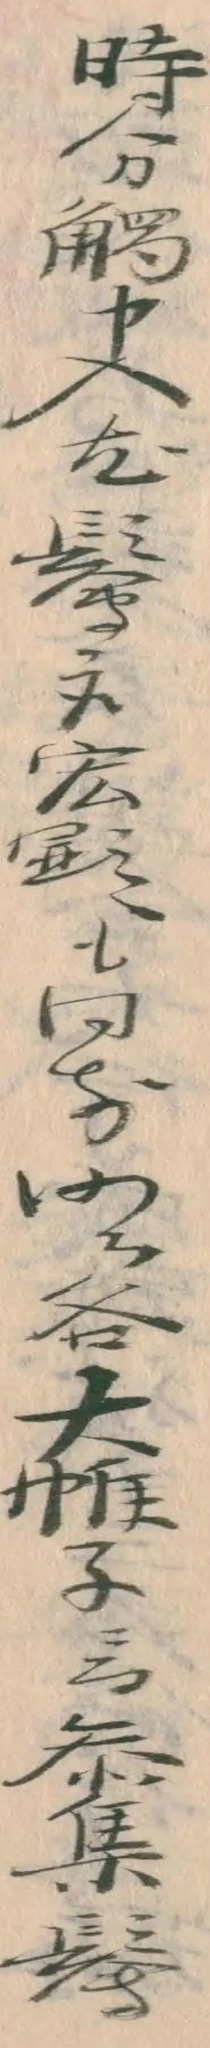時分觸申入尤髭取宏顕へも同前仍而各大帷子ニ而参集髪
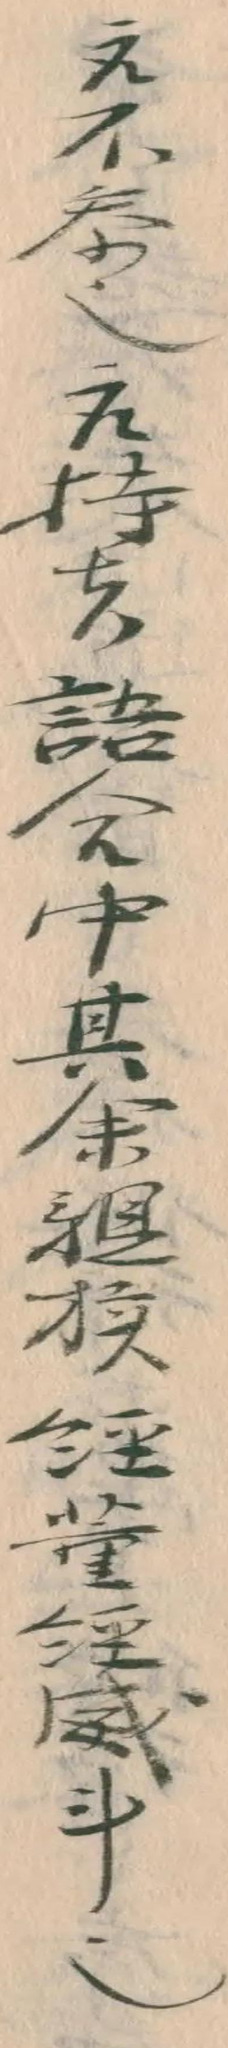取不属也取持者語合中其余親族経董量経威斗也
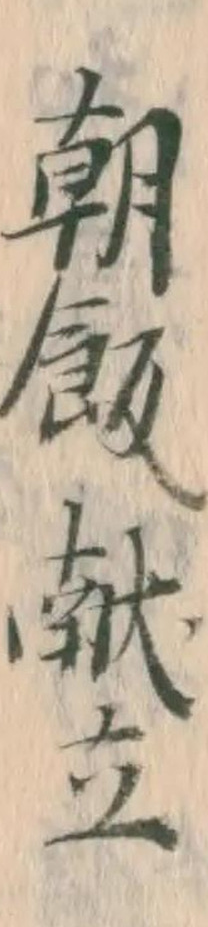朝飯献立
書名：賀茂社記録. 第73冊
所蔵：国立国会図書館 National Diet Library, JAPAN
